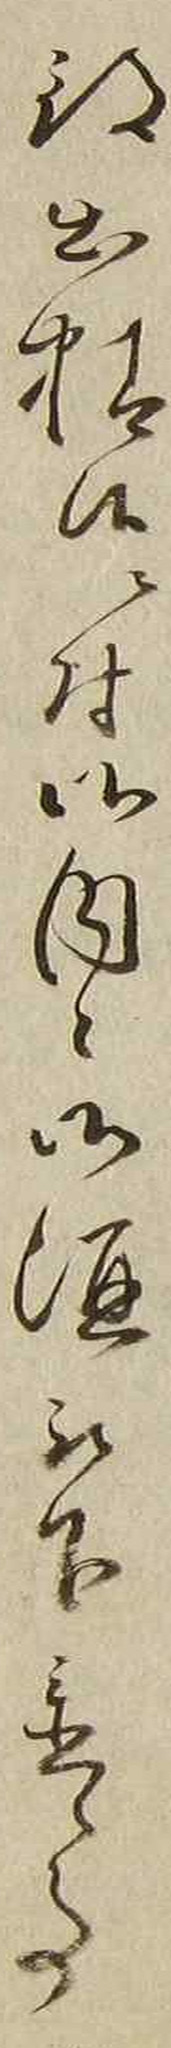致出精候ニ付御内々御酒被下置候事
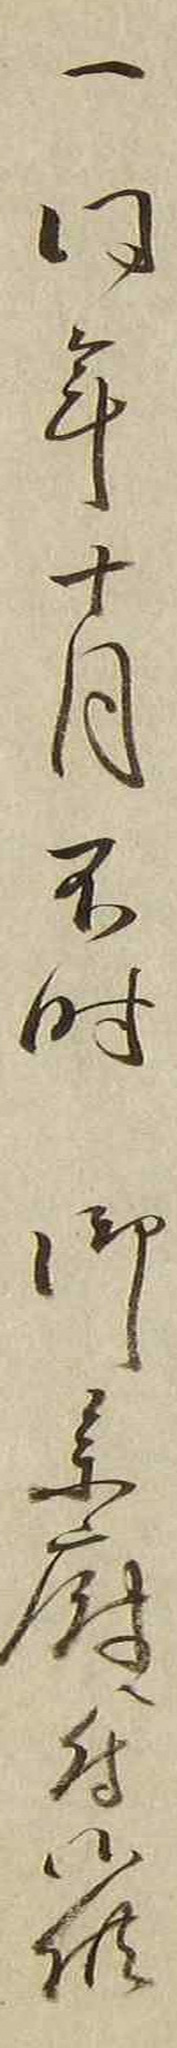一同年十月不時御参府ニ付御供

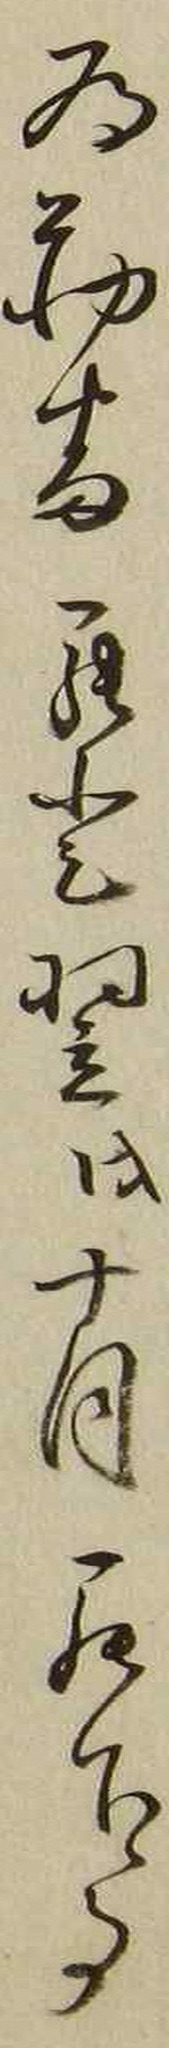為勤番罷登翌戌十月罷下候事
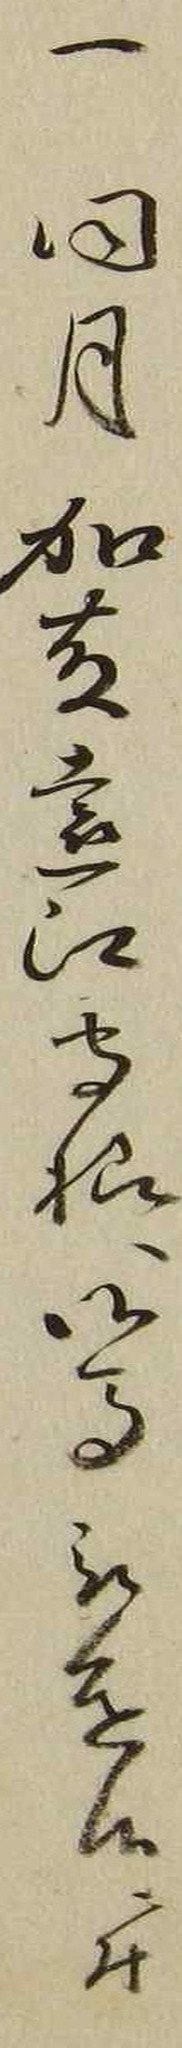一同月加藤遠江守様へ御馬被進候ニ付
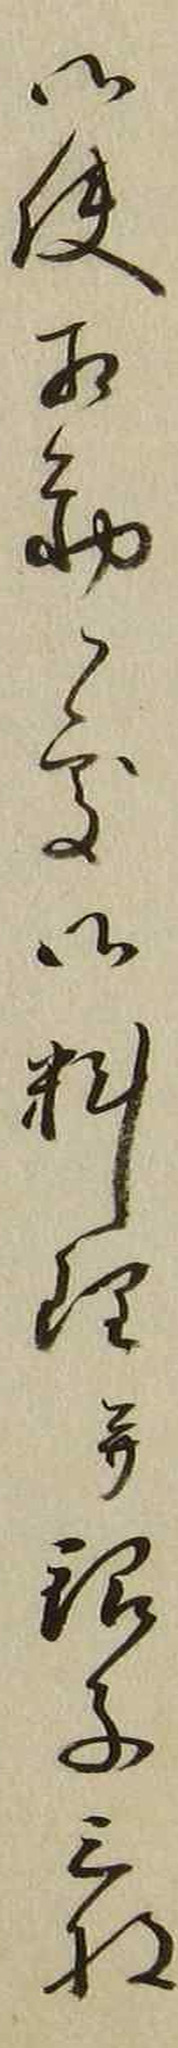御使相勤候処御料理并銀子三枚
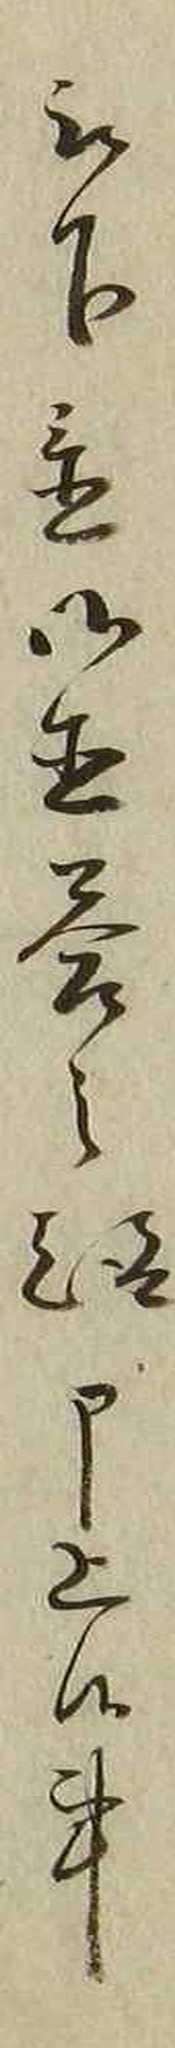被下置御直答之趣申上候事
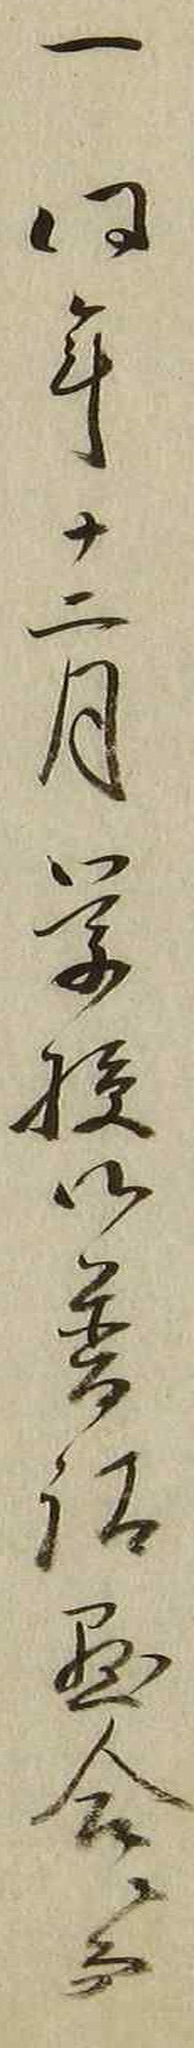一同年十二月学授御普請懸合ニ而
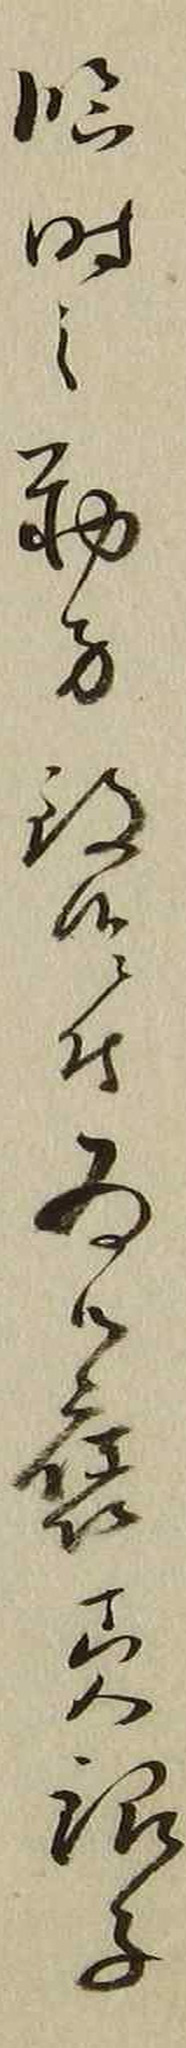臨時之勤方致候ニ付為御褒美銀子
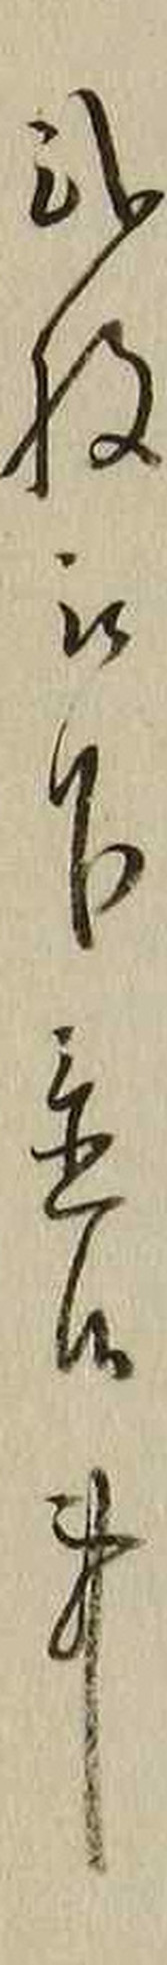弐枚被下置候事
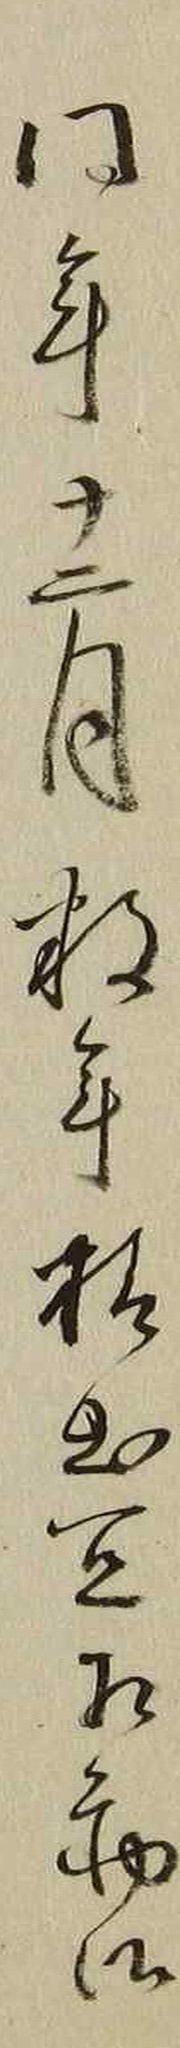一同年十二月数年精出宜相勤御
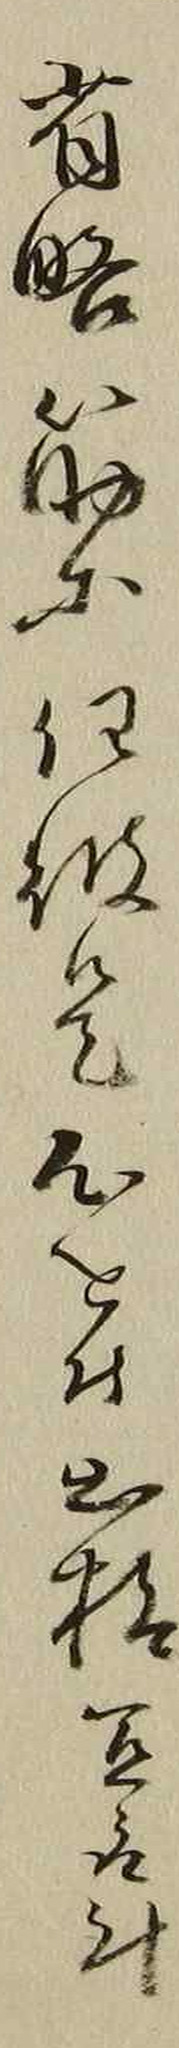省略筋等任彼是心を付出精宜取計
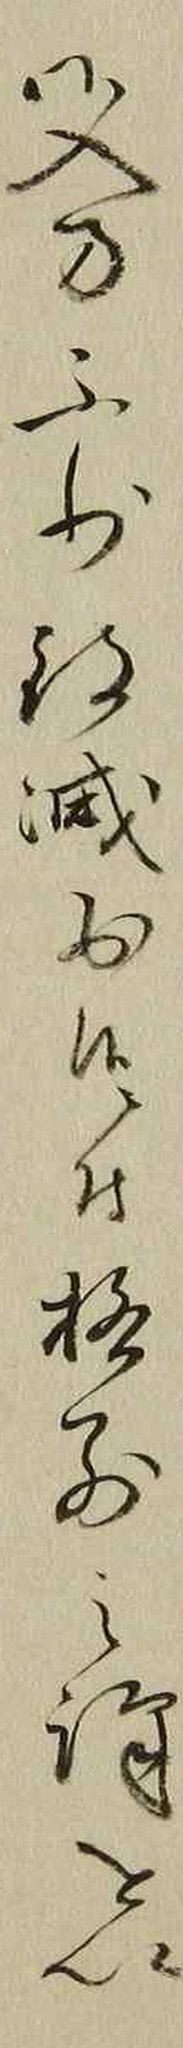御入方不少致減少候ニ付格別之訳を以
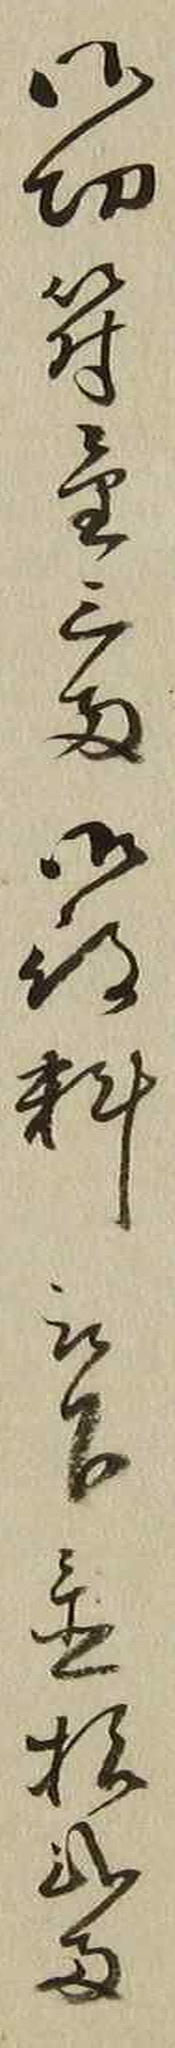御切符金三両御役料被下置拾弐両
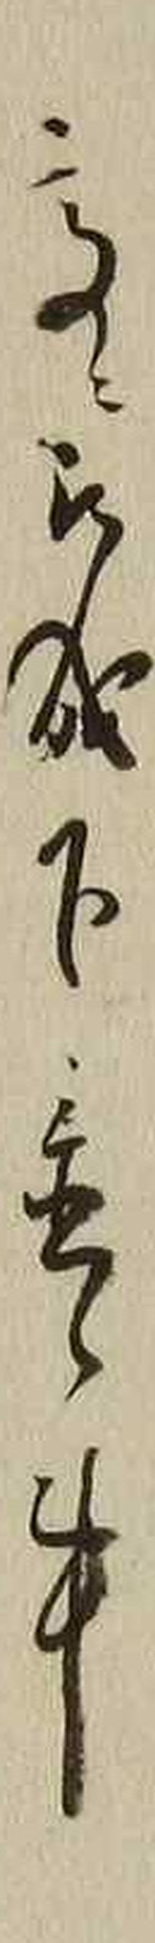高ニ被成下置候事
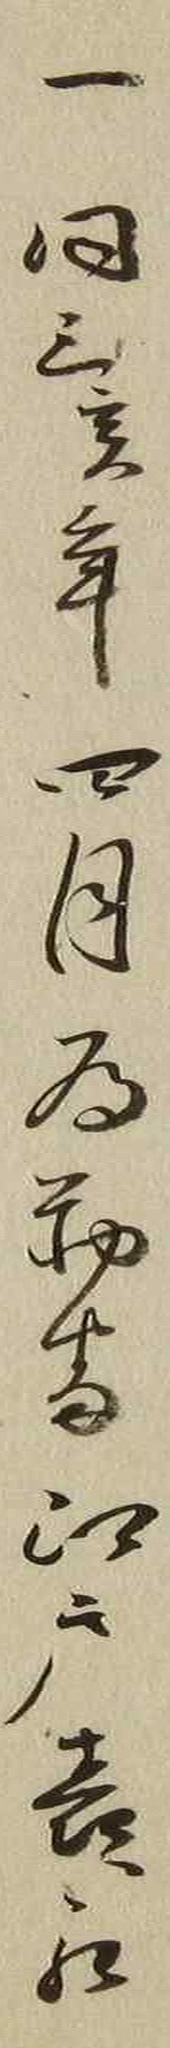一同三亥年四月為勤番江戸表へ被
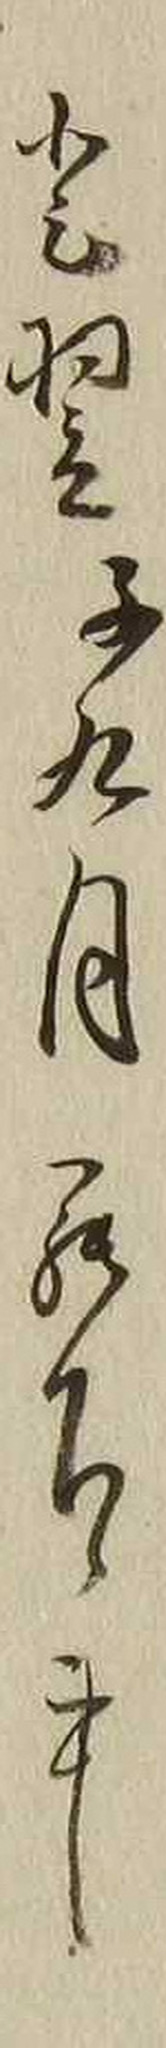罷登翌子九月罷下候事
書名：諸士系譜　巻之25　い之部25
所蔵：会津若松市立会津図書館
